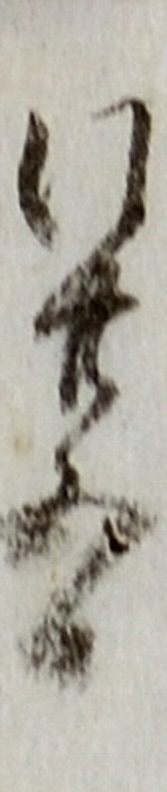同廿五日
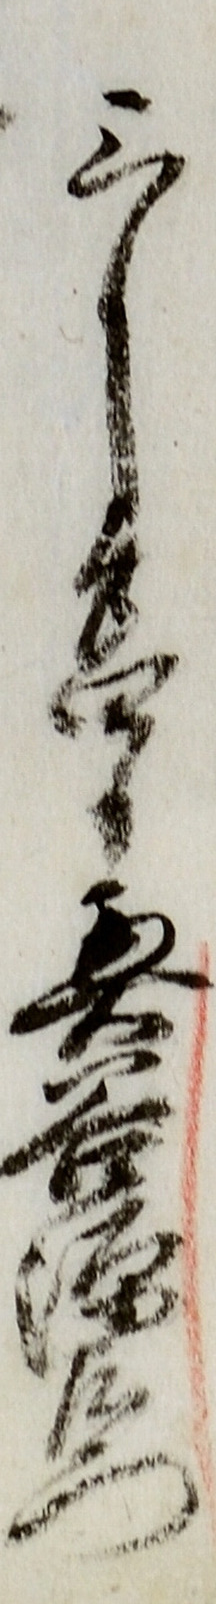三月廿四日奥谷源左衛門
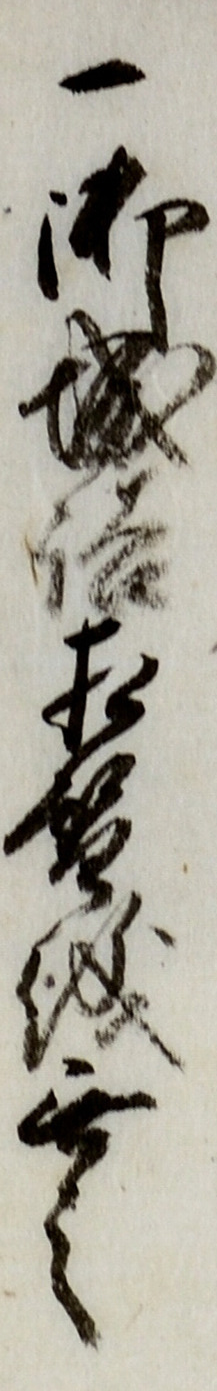一御城詰相替儀無之
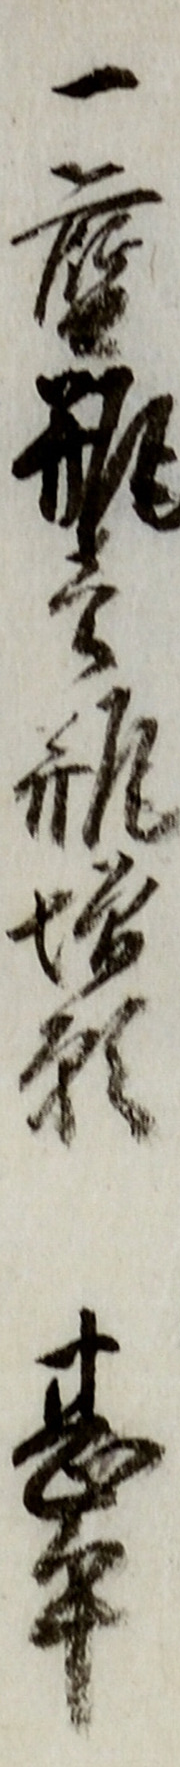一藍瓶壱瓶増願甚平
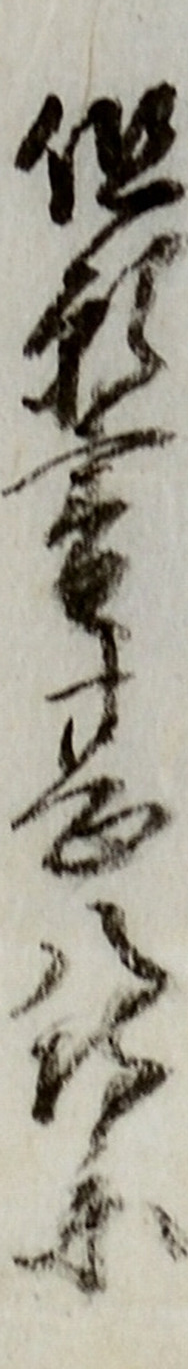但願書甚八持参
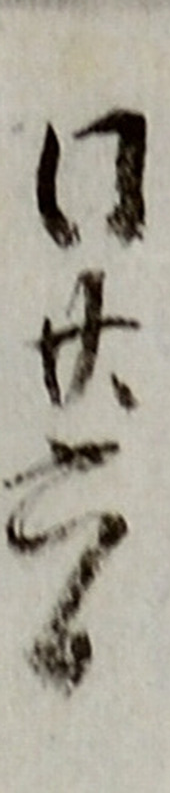同廿五日
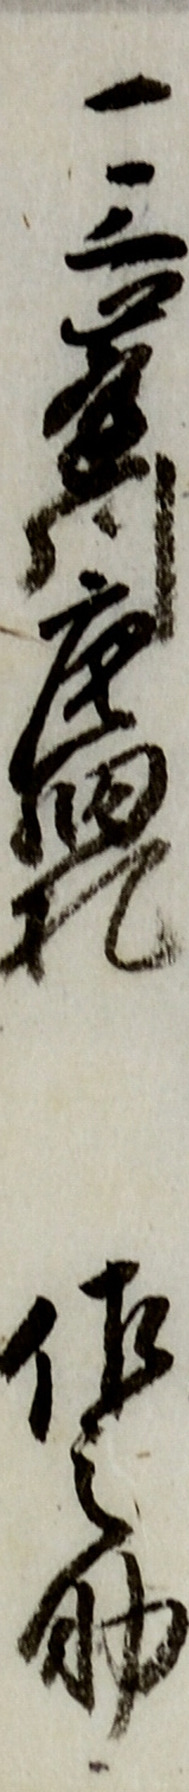一三峰川唐網札佐之助
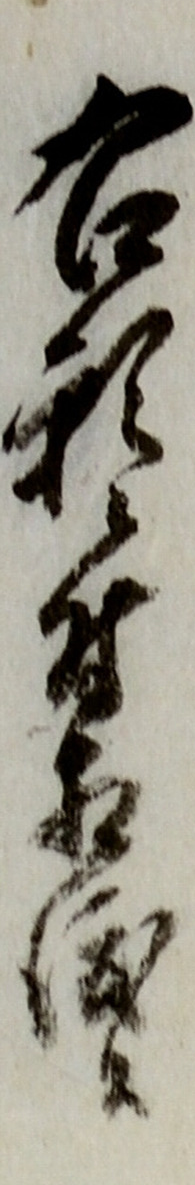右願に付相渡候
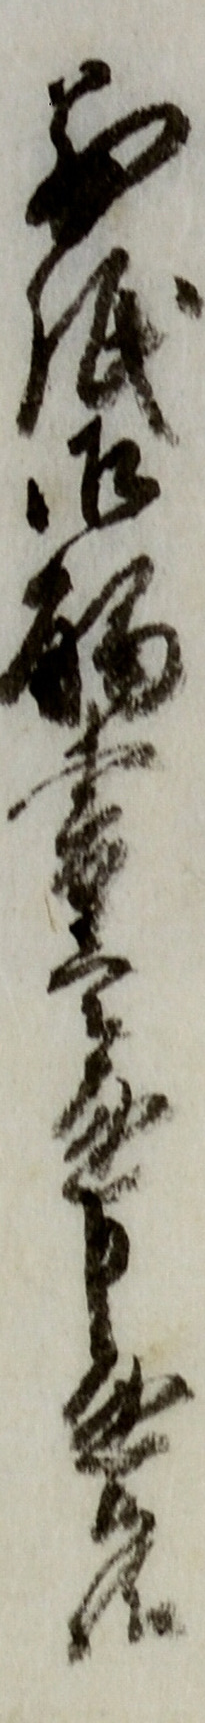別紙御触書壱通申通候様
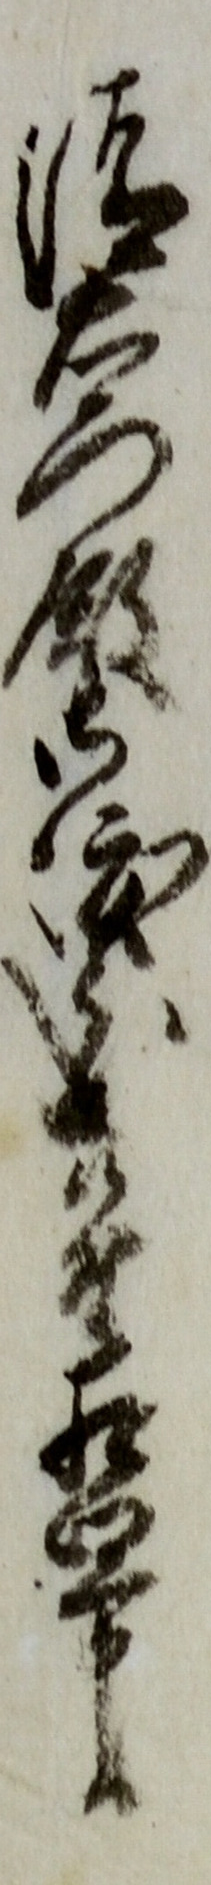清右衛門殿御渡被成候付相廻申候
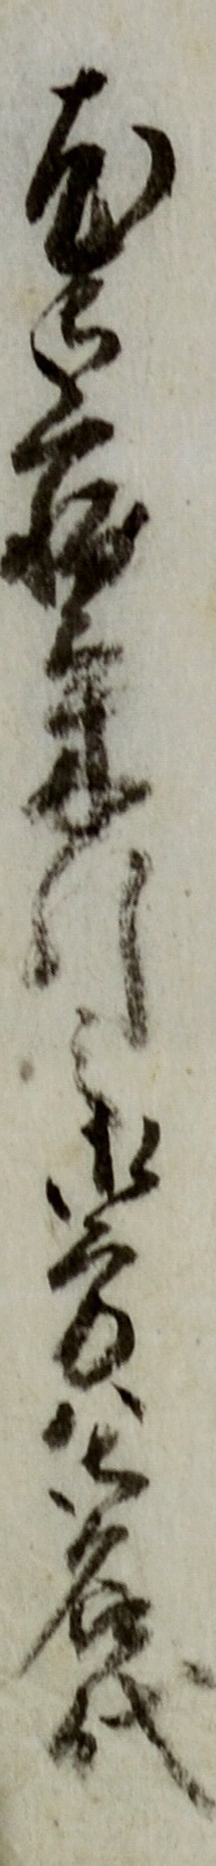尤御病気引之御方は御名代

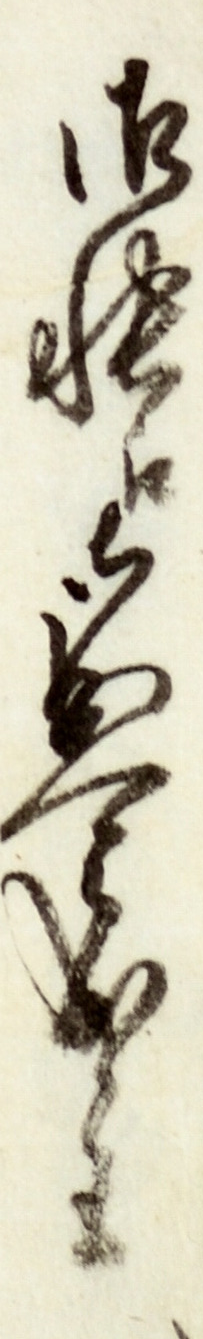御帳え御出可被成候以上
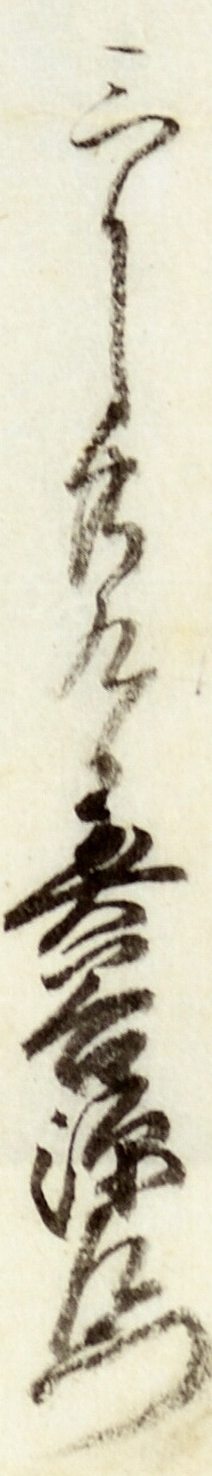三月廿九日奥谷源左衛門
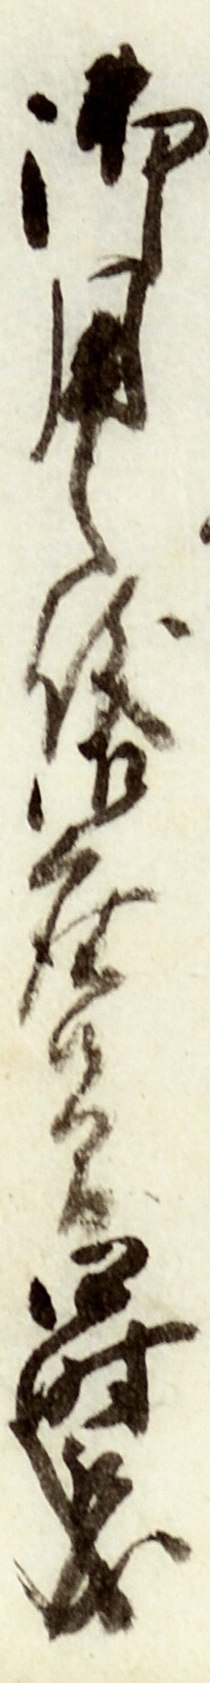御用之儀御座候間四時被成
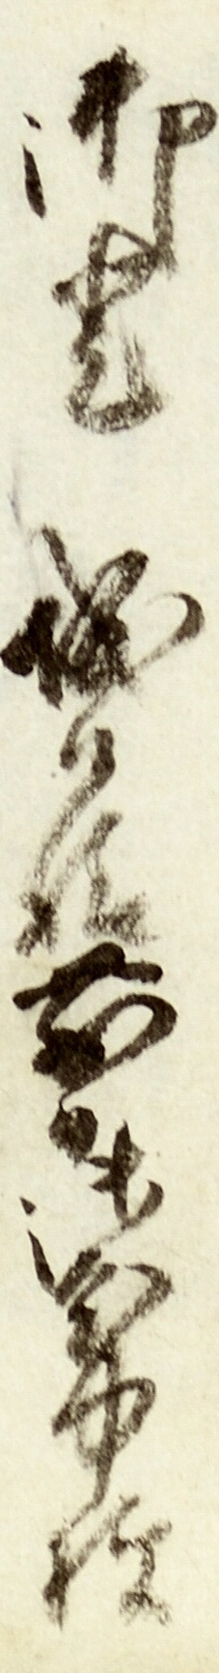御登城候様前日御老中様
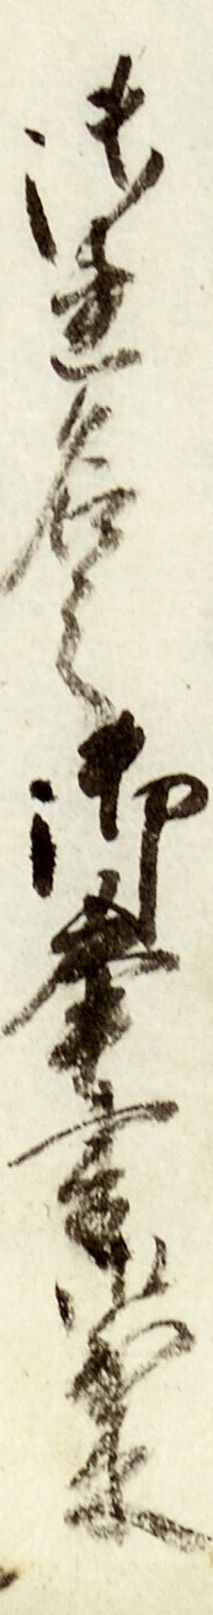御連名之御奉書御到来
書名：諸事御用留帳
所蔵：伊那市立高遠町図書館・合同会社AMANE
